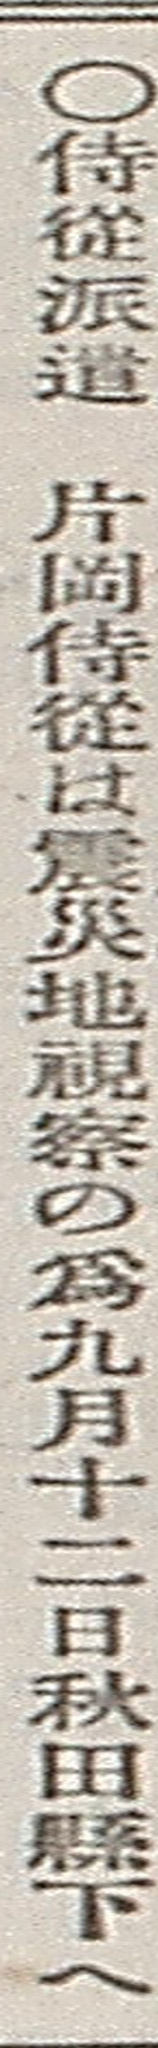〇侍従派遣片岡侍従は震災地視察の為九月十二日秋田県下へ
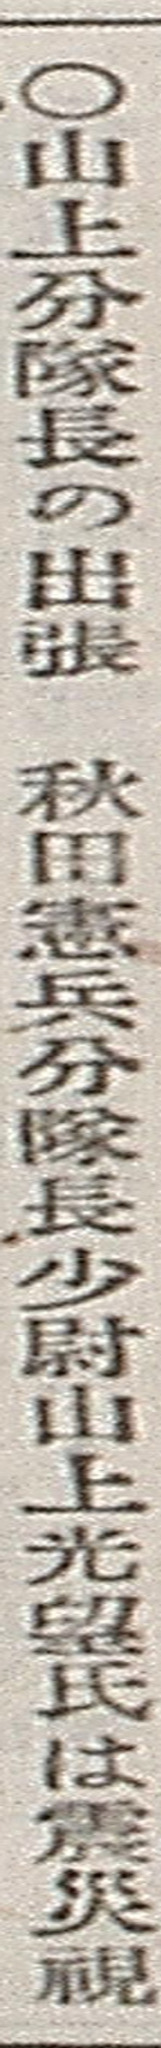〇山上分隊長の出張秋田憲兵分隊長少尉山上光望氏は震災視
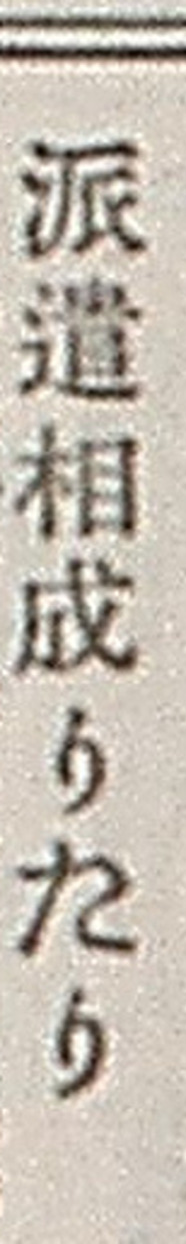派遣相成りたり
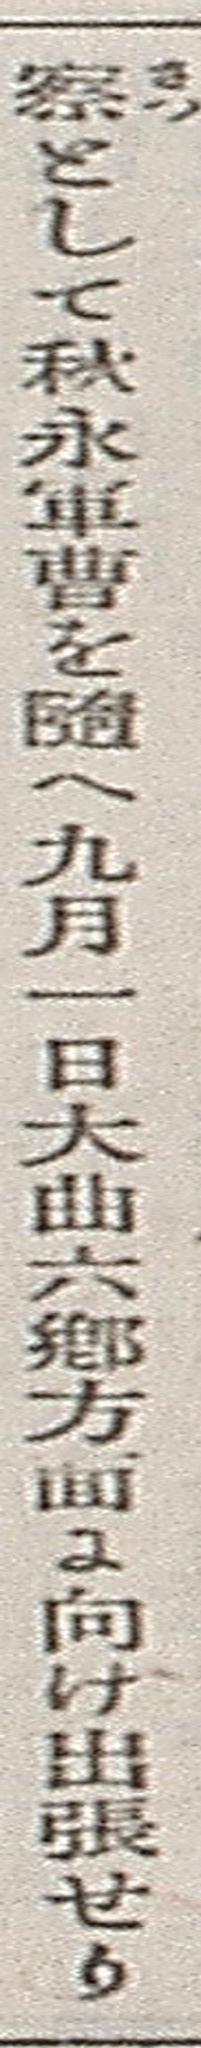察として秋永軍曹を随へ九月一日大曲六郷方面に向け出張せり
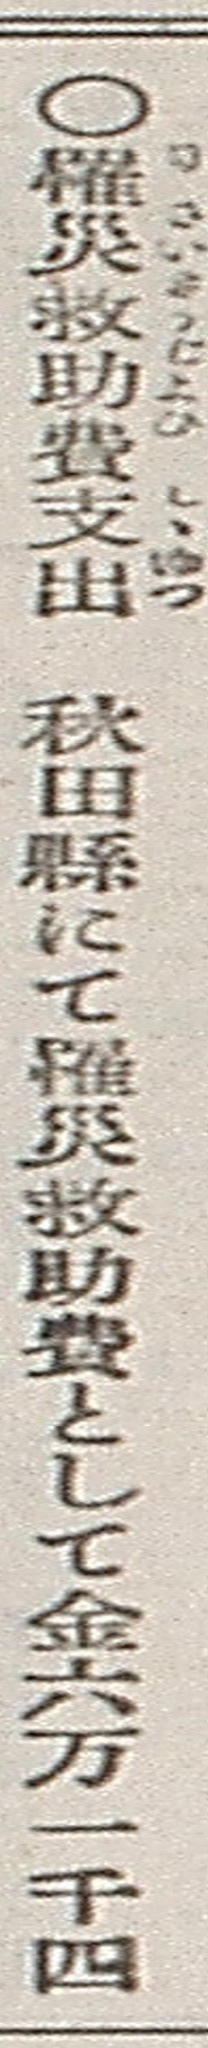〇罹災救助費支出秋田県にて罹災救助費として金六万一千四
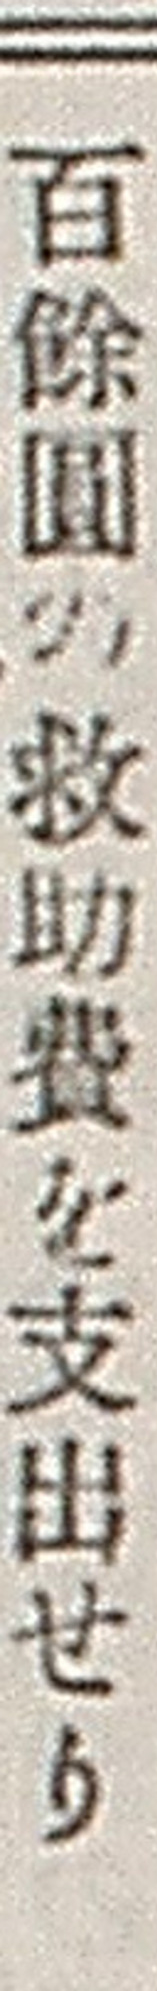百余円の救助費を支出せり
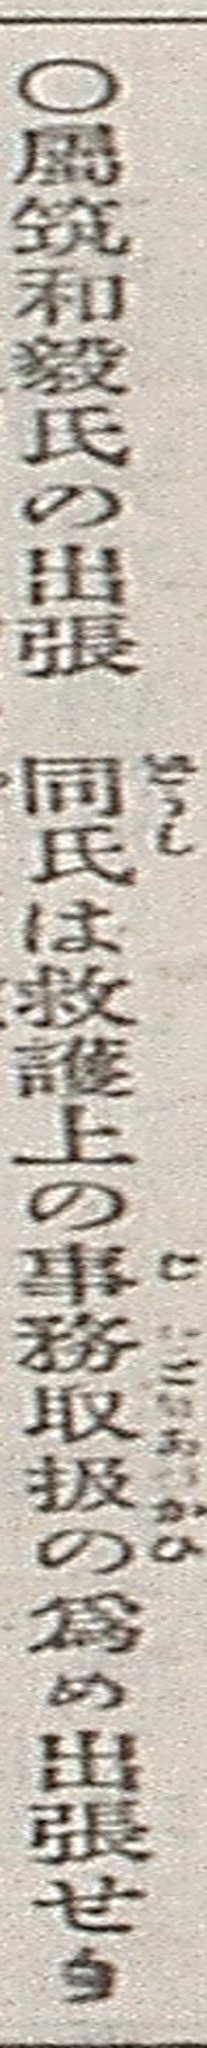〇属筑和毅氏の出張同氏は救護上の事務取扱の為め出張せり
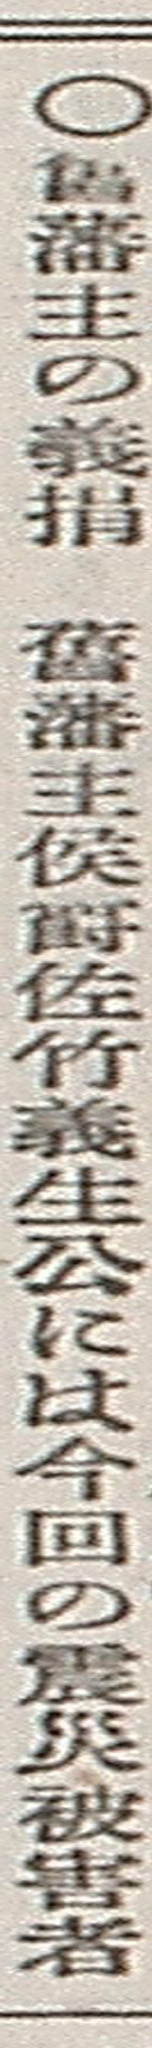〇旧藩主の義捐旧藩主侯爵佐竹義生公には今回の震災被害者
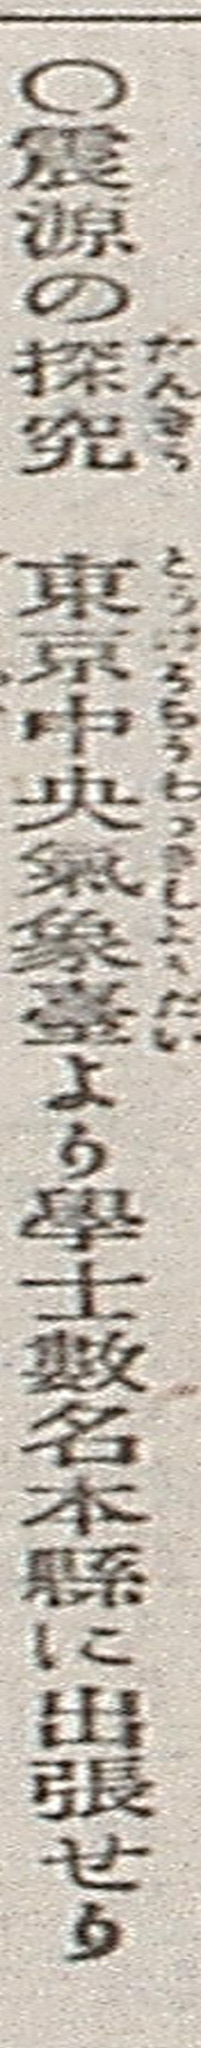〇震源の探究東京中央気象台より学士数名本県に出張せり
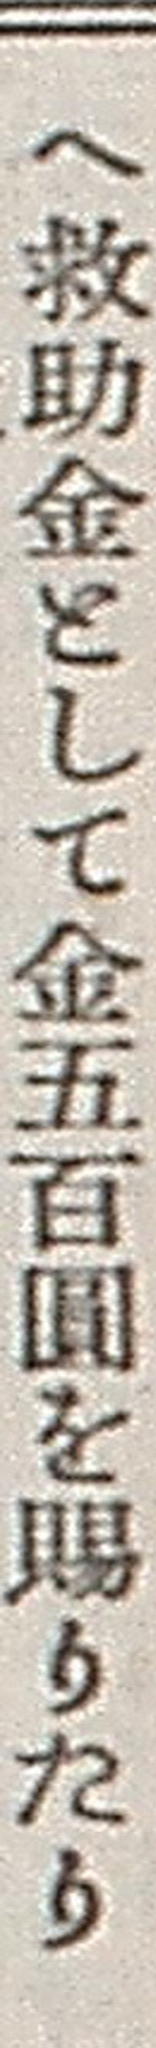へ救助金として金五百円を賜りたり
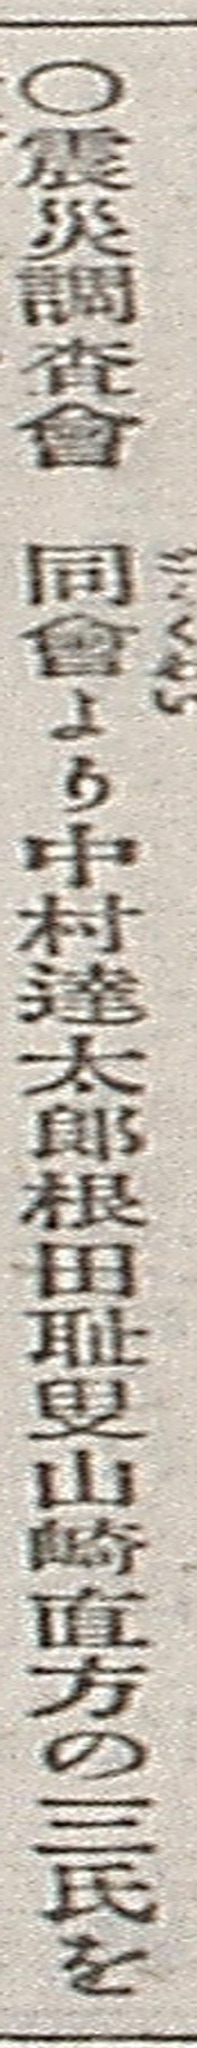〇震災調査会同会より中村達太郎根田耻臾山崎直方の三氏を
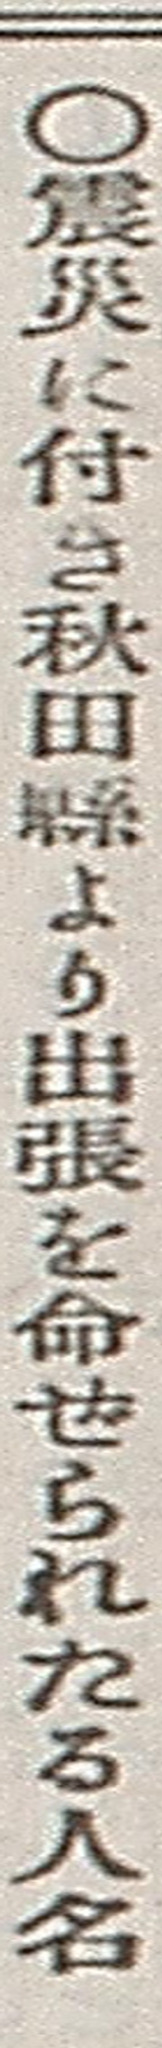〇震災に付き秋田県より出張を命ぜられたる人名
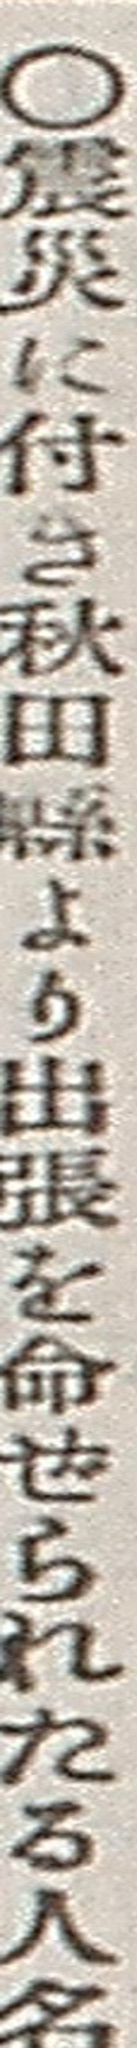〇震災に付き秋田県より出張を命ぜられたる人名
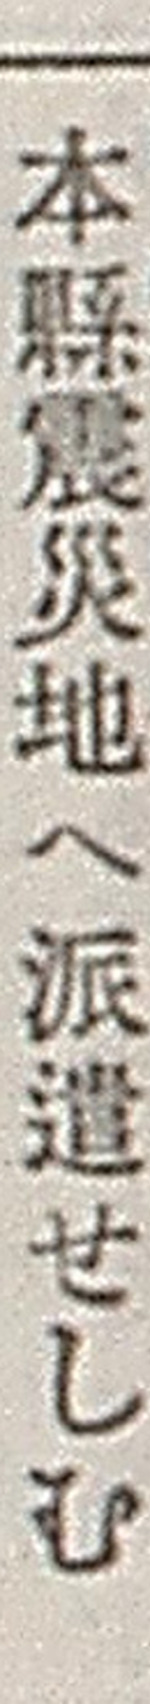本県震災地へ派遣せしむ
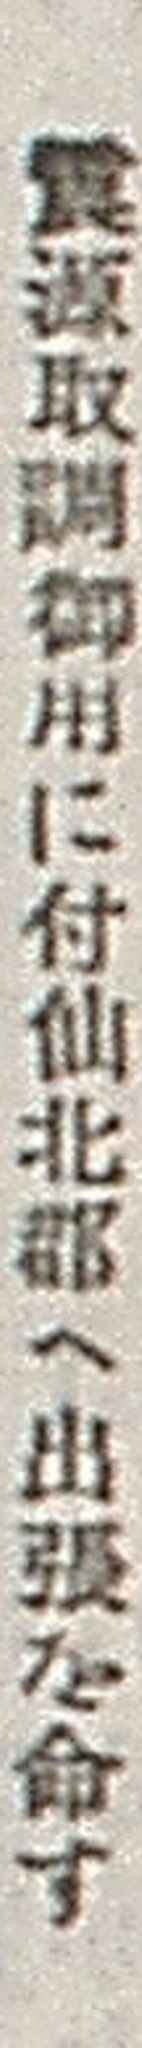震災取調御用に付仙北郡へ出張を命す
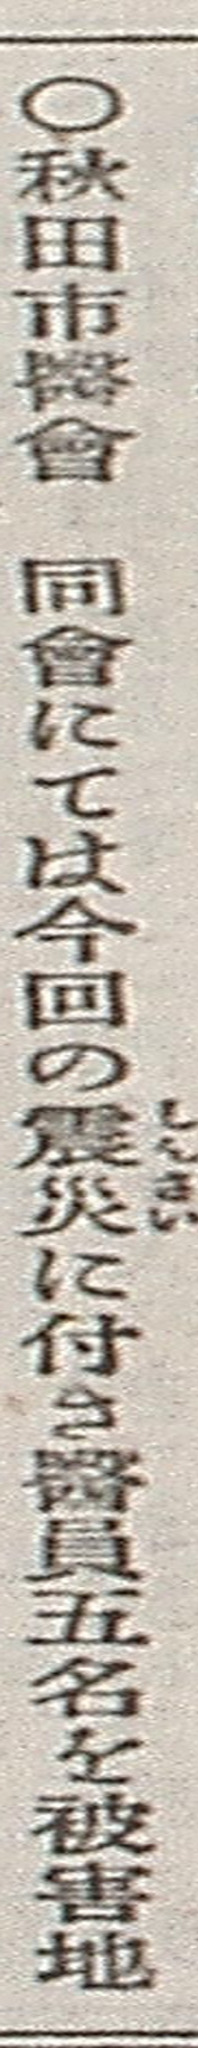〇秋田市医会同会にては今回の震災に付き医員五名を被害地
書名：風俗畫報臨時増刊第百二十四號　洪水地震被害録（上）
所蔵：東京大学地震研究所図書室 Earthquake Research Institute Library, The University of Tokyo, JAPAN
